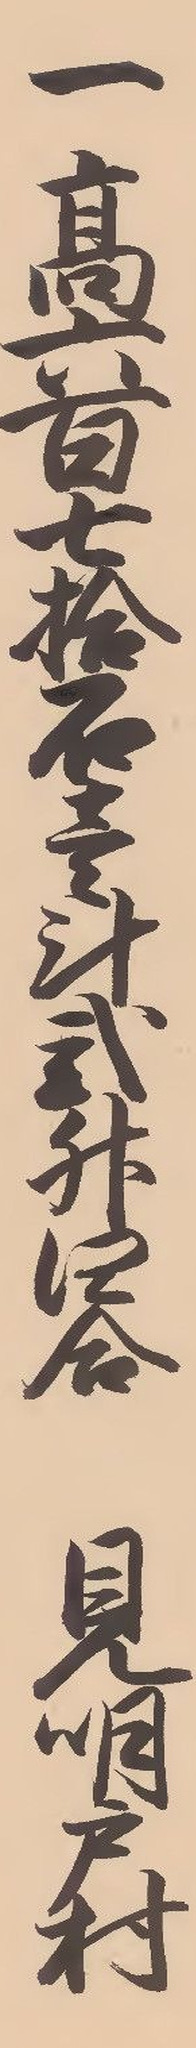一高六百七拾石壱斗弐升四合見明戸村
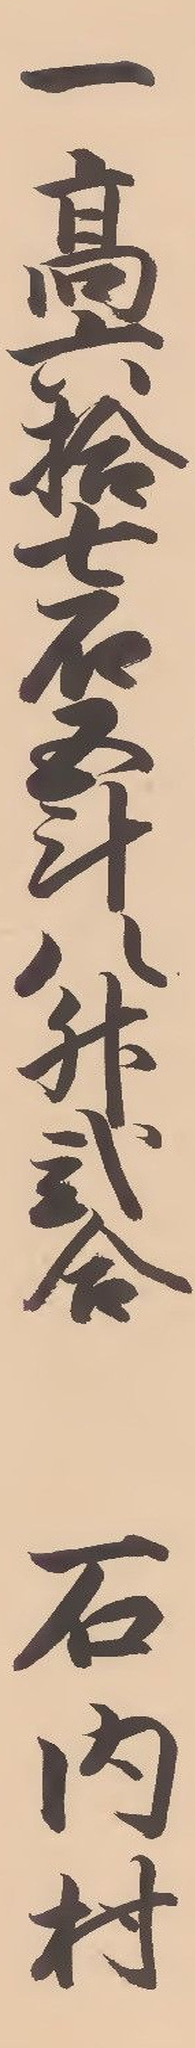一高六拾七石五斗八升弐合石内村
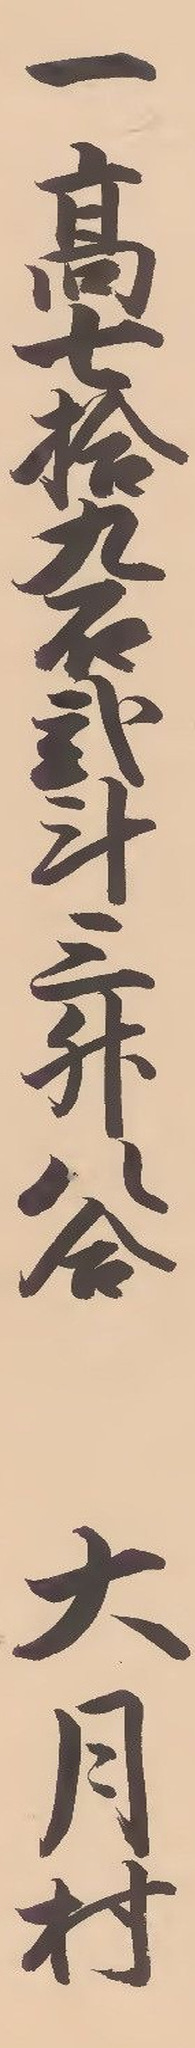一高七拾九石弐斗三升八合大月村

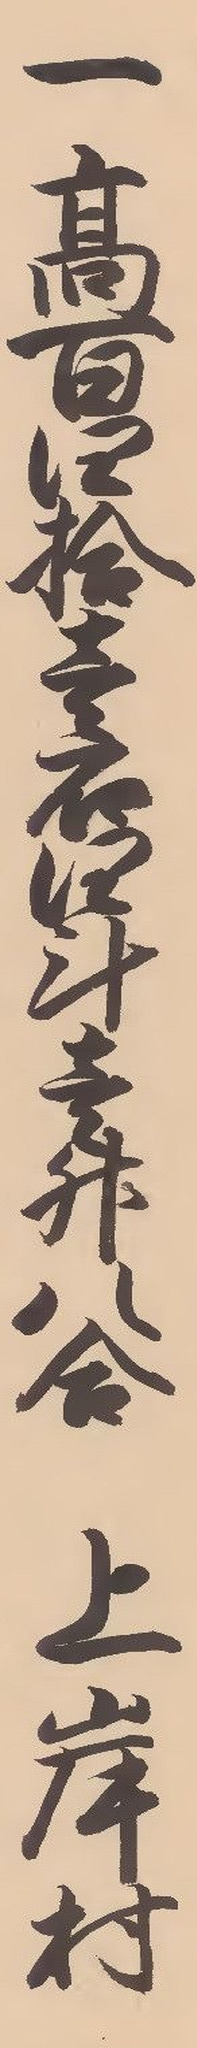一高百四拾壱石四斗壱升八合上岸村
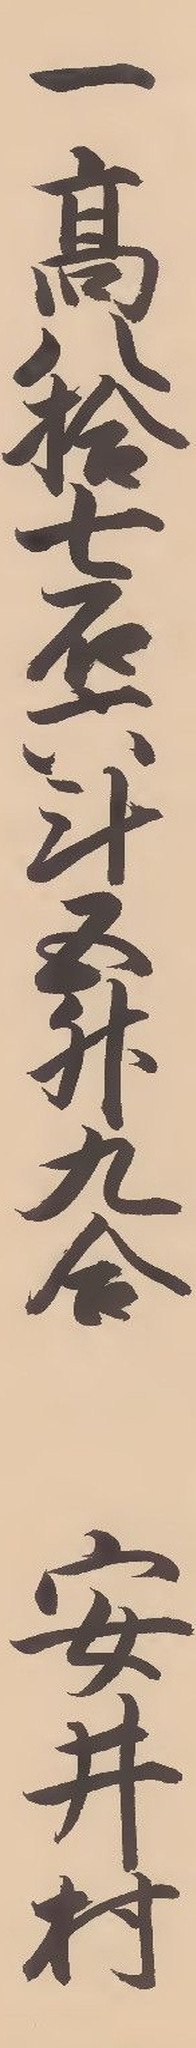一高八拾七石六斗五升九合安井村
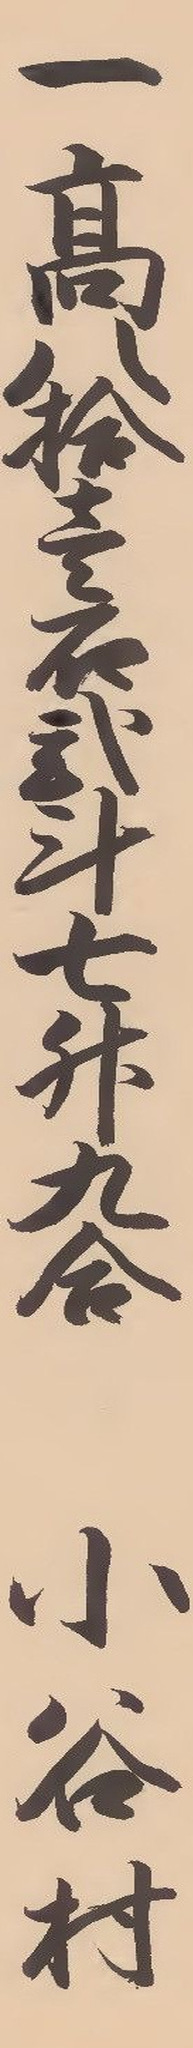一高八拾壱石弐斗七升九合小谷村
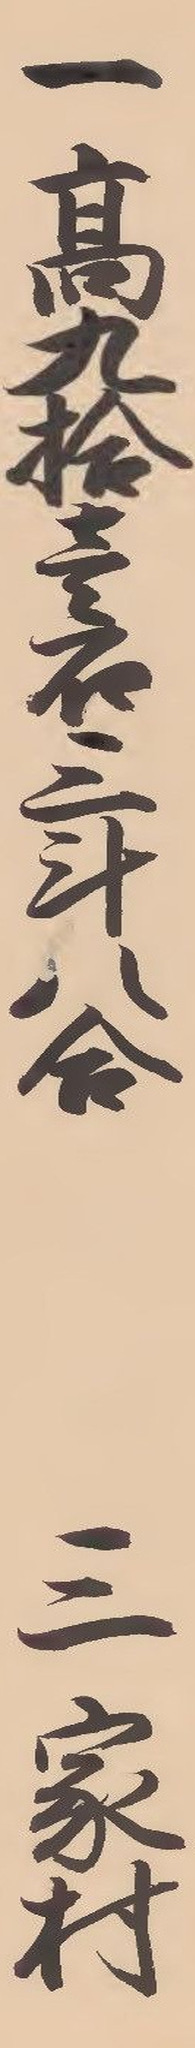一高九拾壱石三斗八合三家村
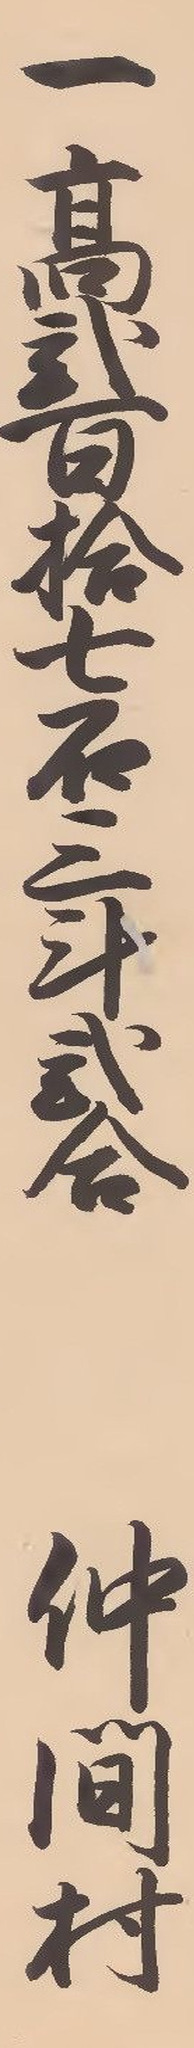一高弐百拾七石三斗弐合仲間村
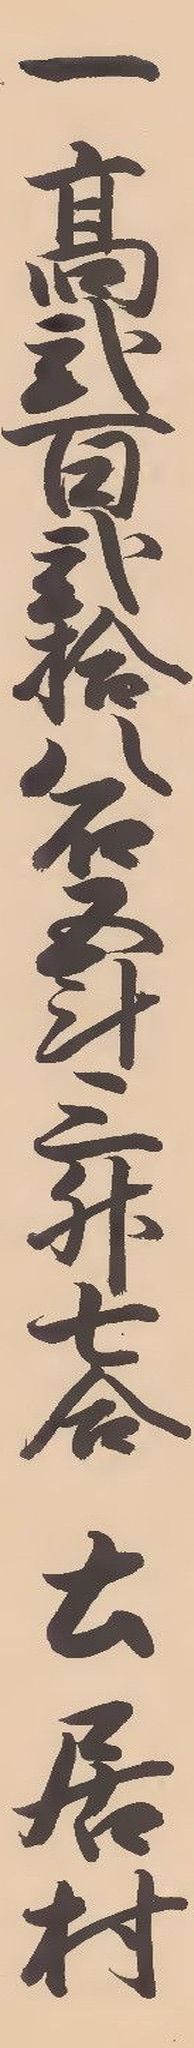一高弐百弐拾八石五斗三升七合土居村
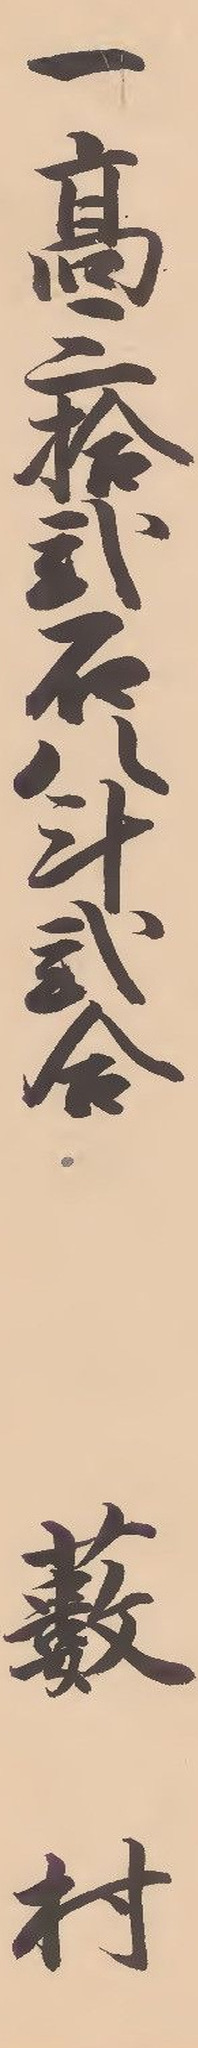一高三拾弐石八斗弐合薮村

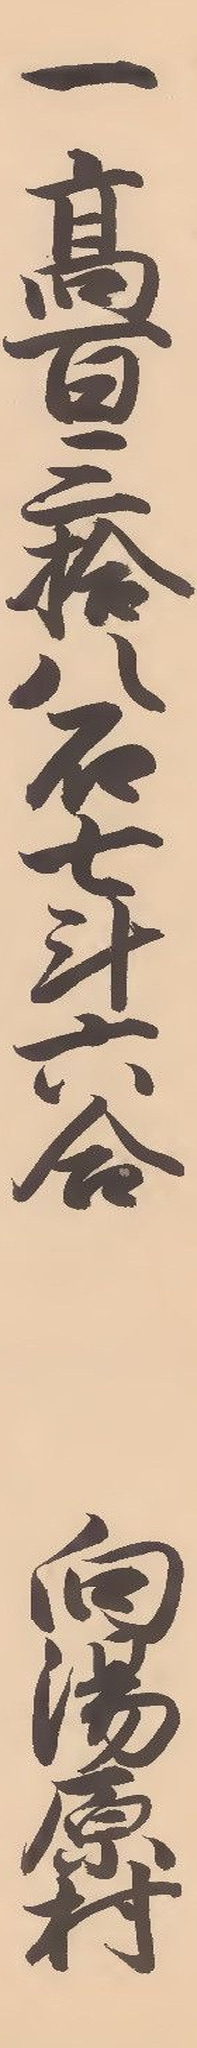一高百三拾八石七斗六合向湯原村
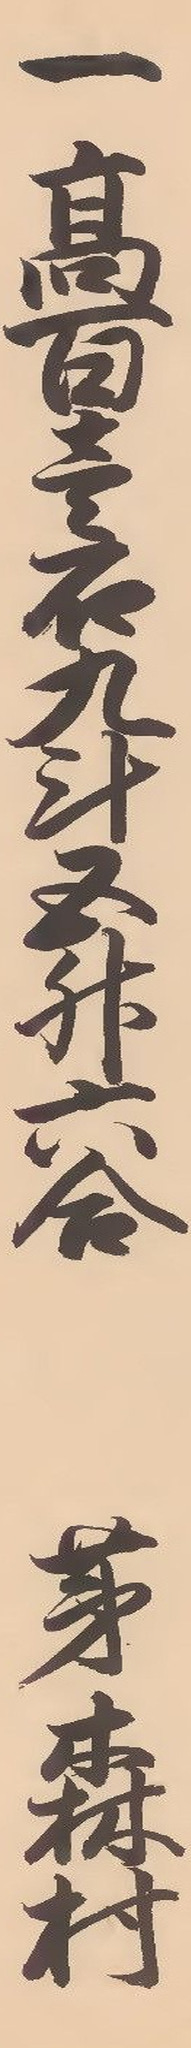一高百壱石九斗五升六合茅森村
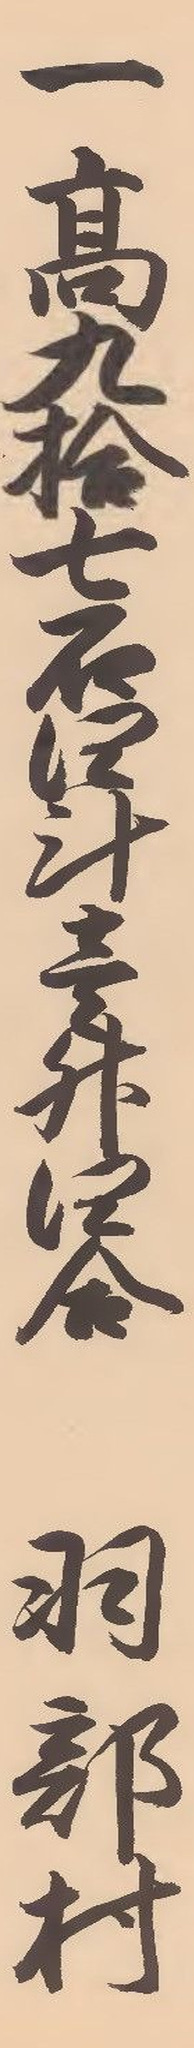一高九拾七石四斗壱升四合羽部村
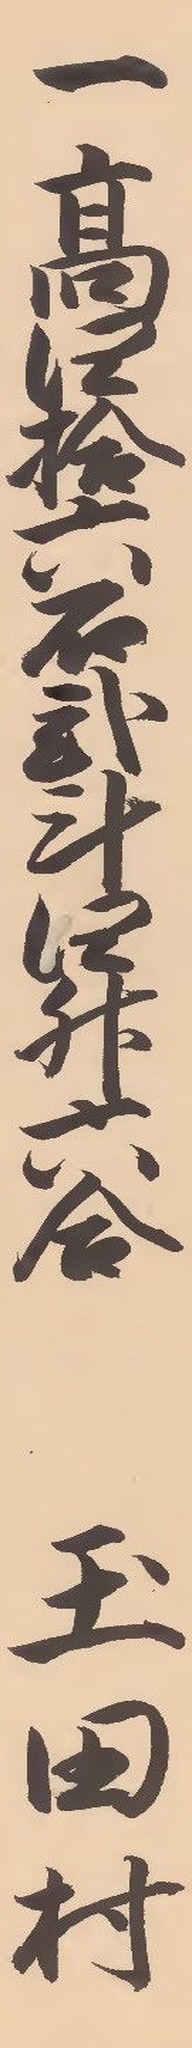一高四拾六石弐斗四升六合玉田村
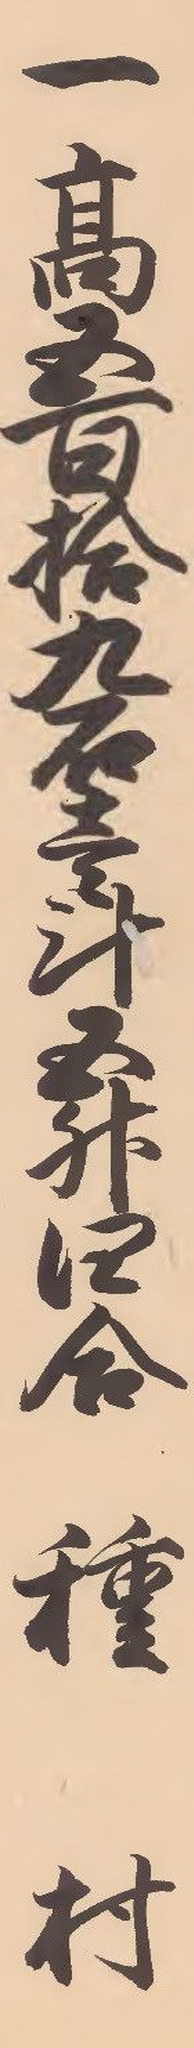一高五百拾九石壱斗五升四合種村
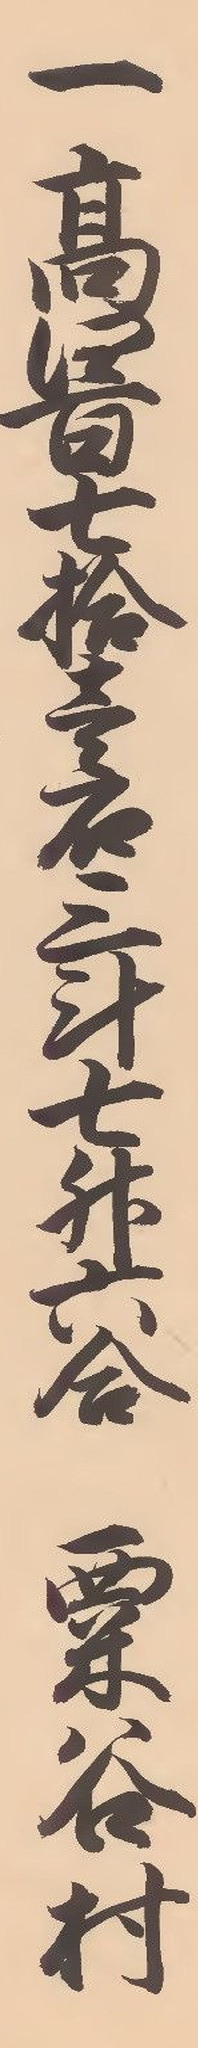一高四百七拾壱石三斗七升六合粟谷村
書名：美作国郷帳
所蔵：国立公文書館 National Archives of Japan
